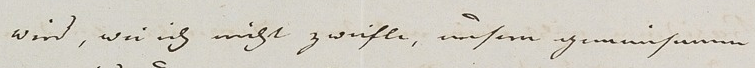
wird, wie ich nicht zweifle, unsern gemeinsamen
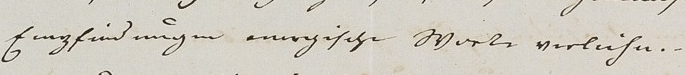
Empfindungen energische Worte verleihn. –
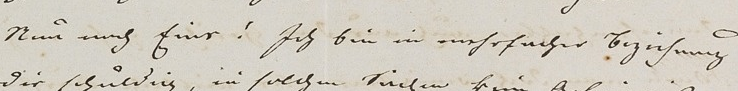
Nun noch Eins! Ich bin in mehrfacher Beziehung
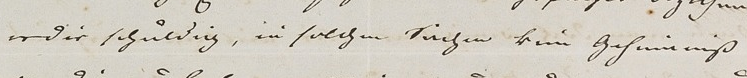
es dir schuldig, in solchen Sachen kein Geheimniß
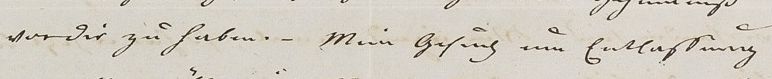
vor dir zu haben. – Mein Gesuch um Entlassung
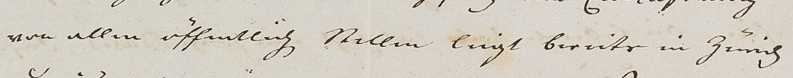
von allen öffentlichen Stellen liegt bereits in Zürich
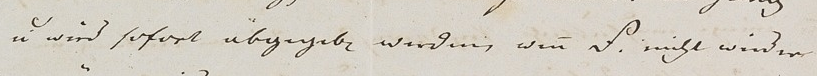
u wird sofort übergeben werden, wenn F. nicht wieder
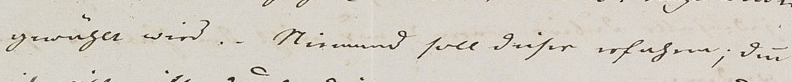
gewählt wird. – Niemand soll dieses erfahren; denn
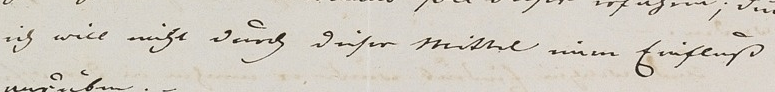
ich will nicht durch dieses Mittel einen Einfluß
